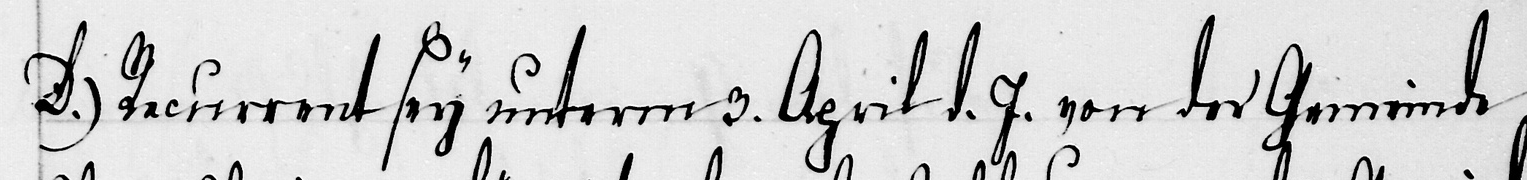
D.) Recurrent sey unterm 3. April d. J. von der Gemeinde
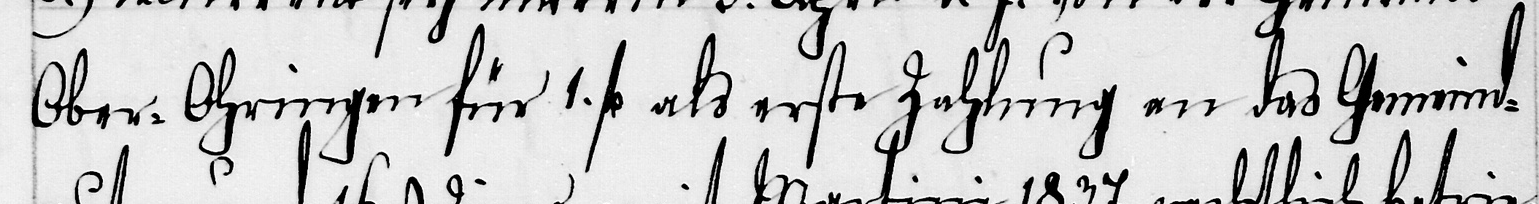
Ober-Ohringen für 1. fl. als erste Zahlung an das Gemeind¬
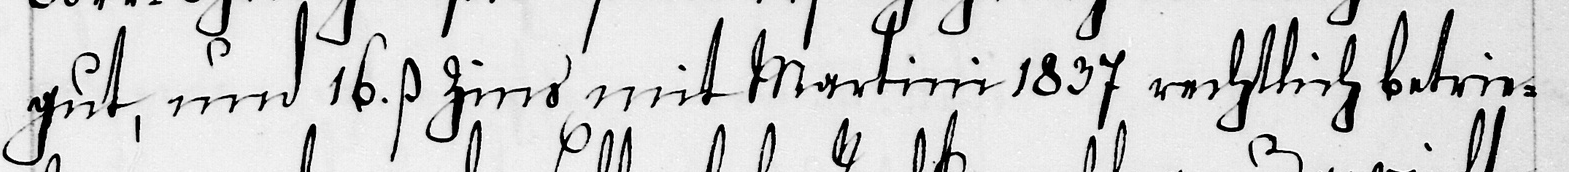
gut, und 16. ß Zins mit Martini 1837 rechtlich betrie¬
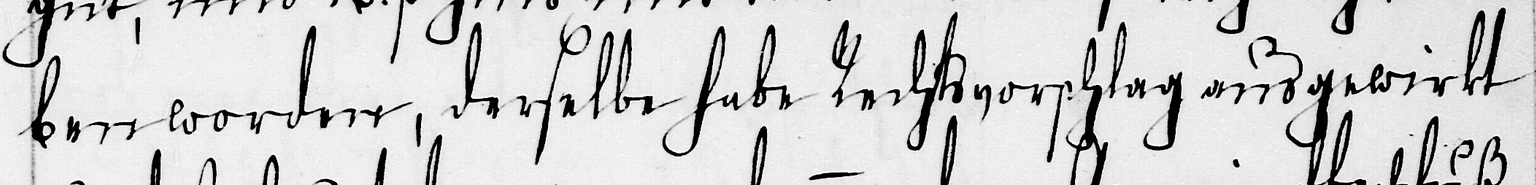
ben worden, derselbe habe Rechstvorschlag ausgewirkt
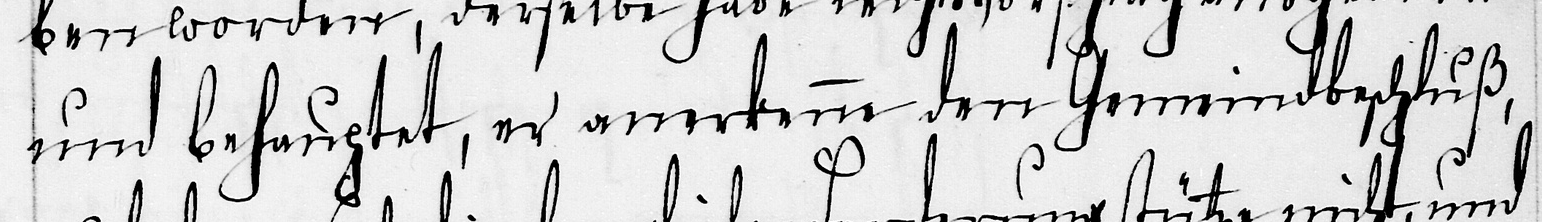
und behauptet, er anerkenne den Gemeindbeschluß,
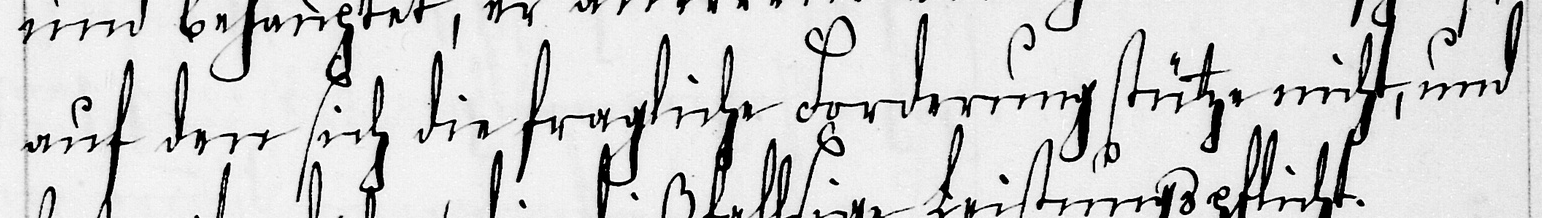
auf den sich die fragliche Forderung stütze nicht, und
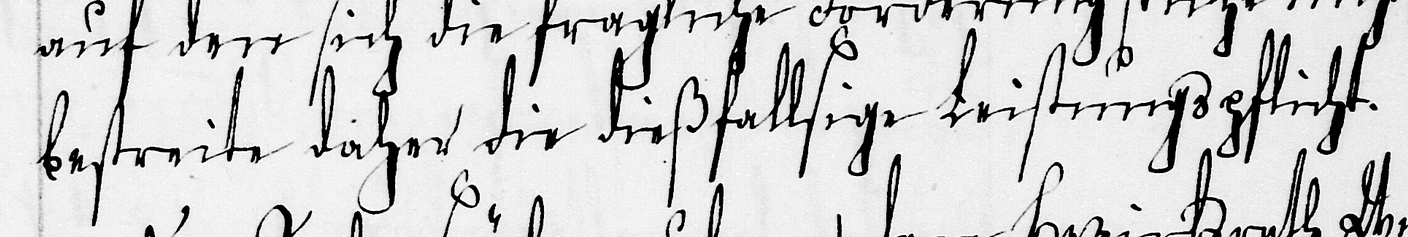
bestreite daher die dießfallige Leistungspflicht.
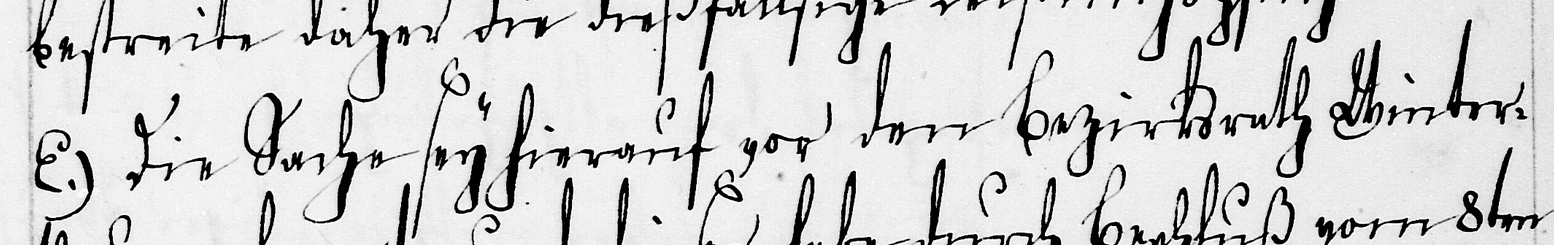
E.) Die Sache sey hierauf vor den Bezirksrath Winter¬
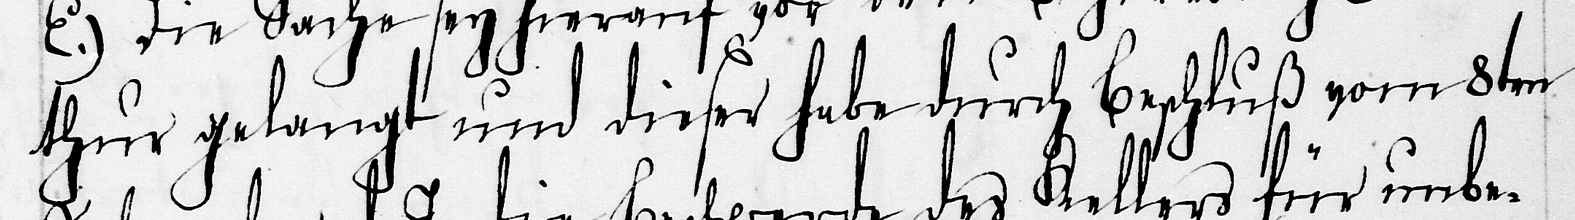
thur gelangt und dieser habe durch Beschluß vom 8ten
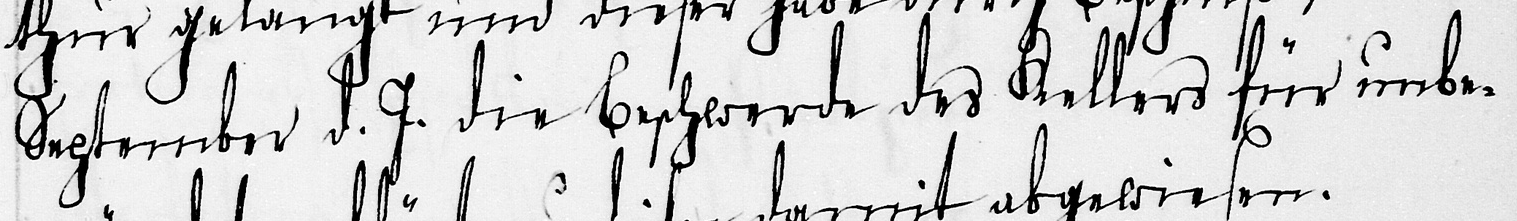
September d. J. die Beschwerde des Kellers für unbe¬
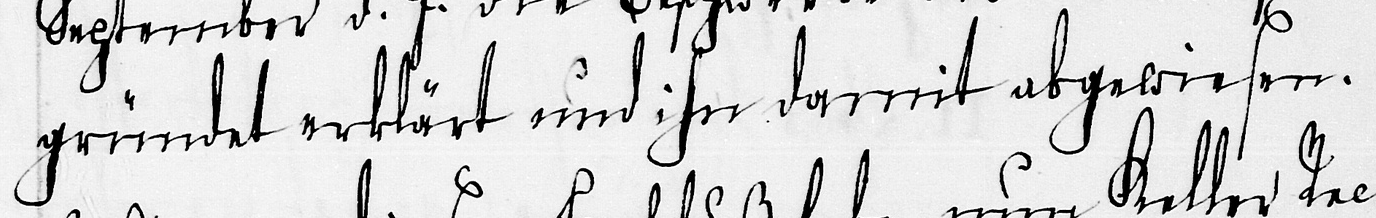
gründet erklärt und ihn damit abgewiesen.
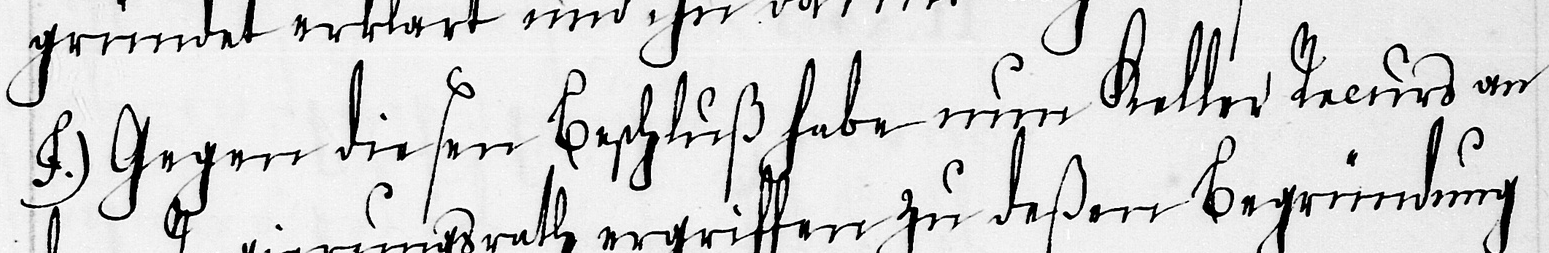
F.) Gegen diesen Beschluß habe nun Keller Recurs an
